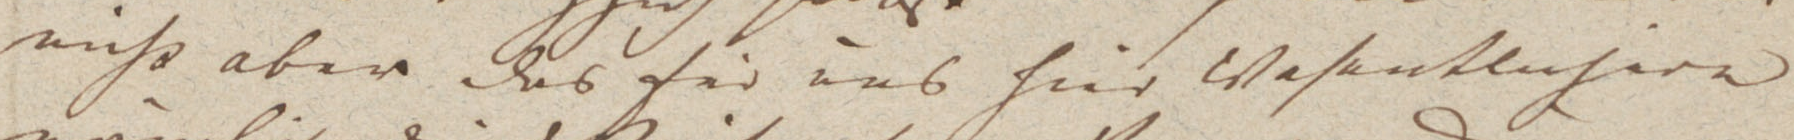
nicht aber das für uns hier Wesentlichere
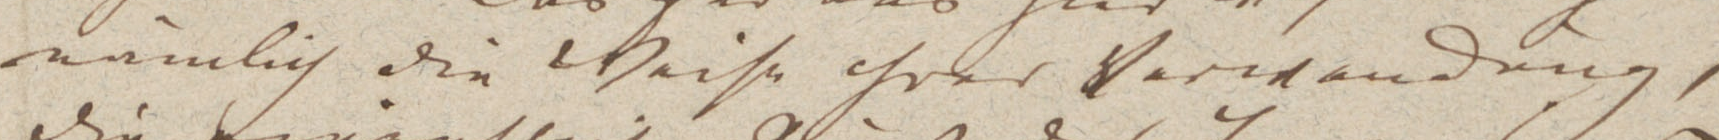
nämlich die Weise ihrer Verwendung,
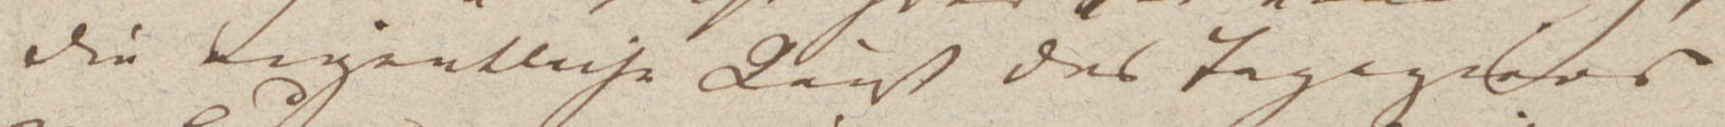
die eigentliche Kunst des Tapeziers
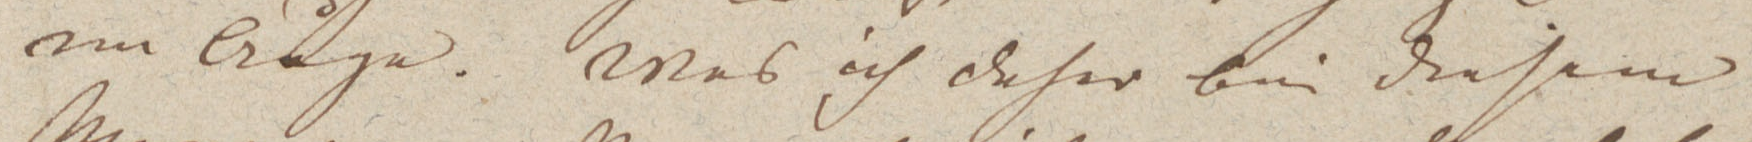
im Auge. Was ich daher bei diesem
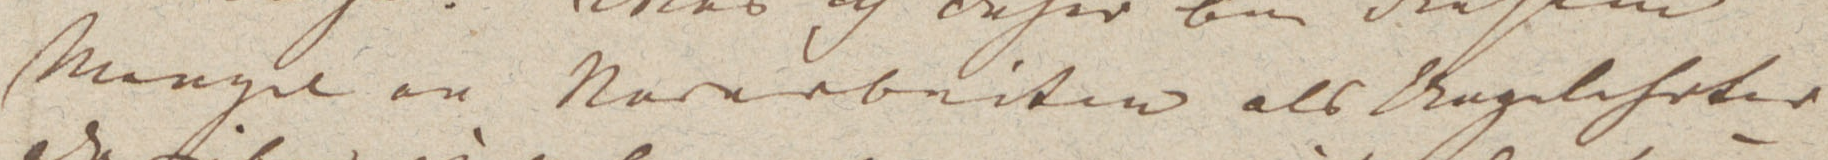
Mangel an Vorarbeiten als Ungelehrter
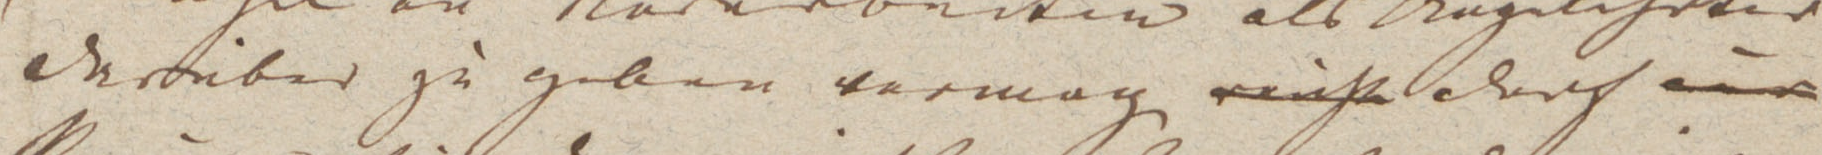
darüber zu geben vermag reicht darf nur
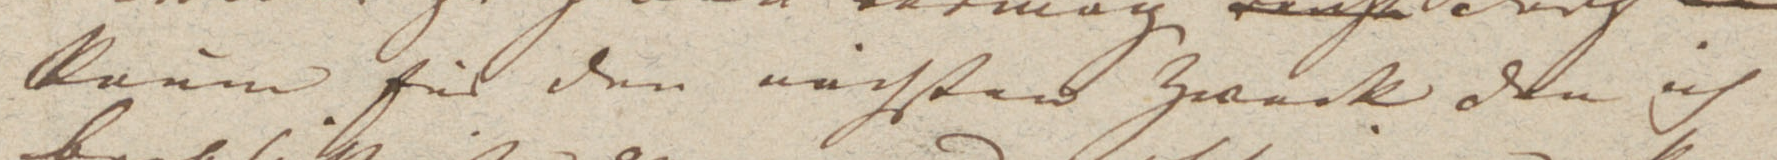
kaum für den nächsten Zweck den ich
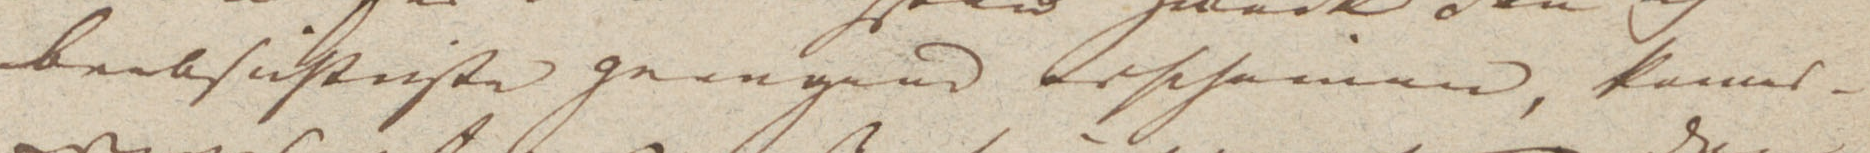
beabsichtigte genugend erscheinen, keines-
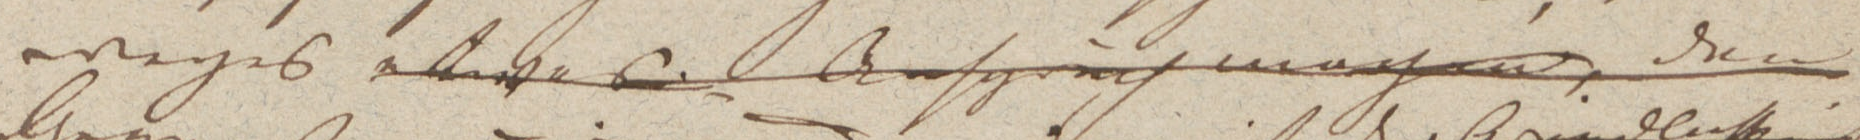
weges etwas Anspruch machen, den
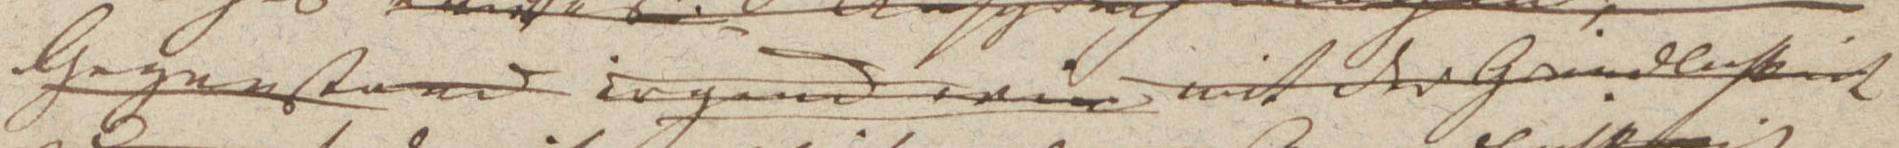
Gegenstand irgendwie mit der Gründlichkeit
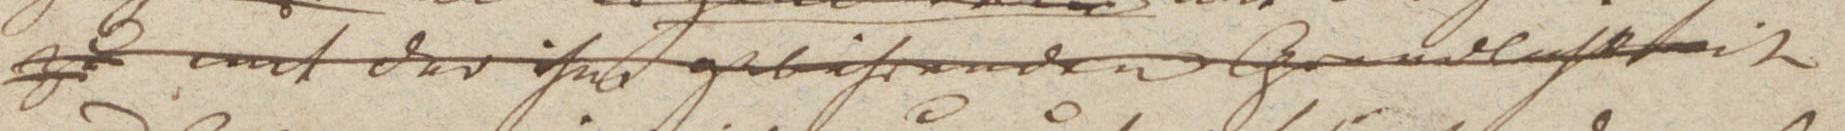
zu mit der ihm gebührenden Grundlichkeit
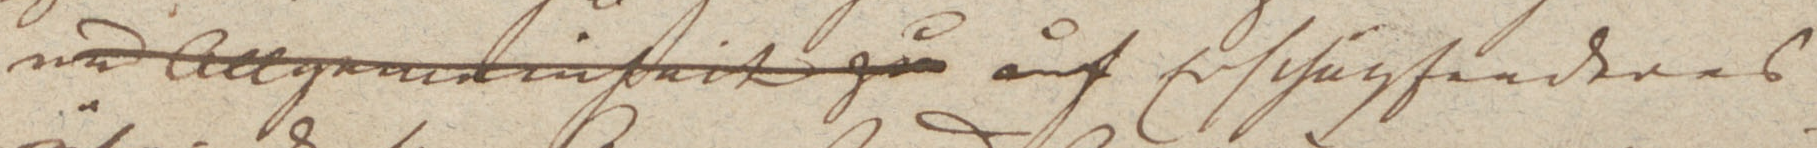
und Allgemeinheit zu auf Erschöpfenderes
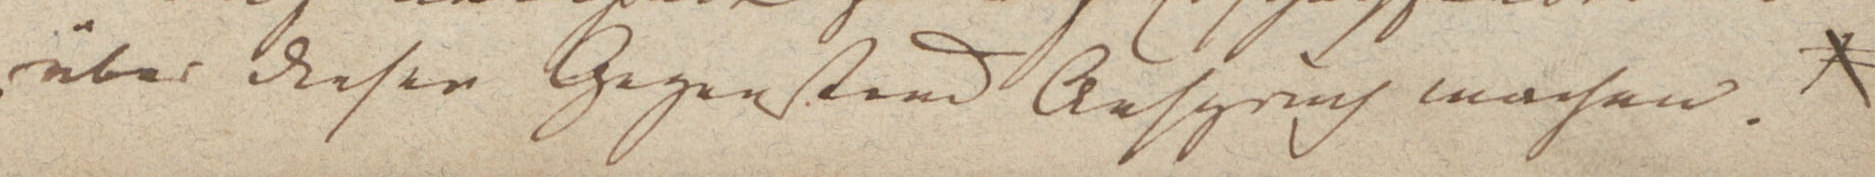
über diesen Gegenstand Anspruch machen. %
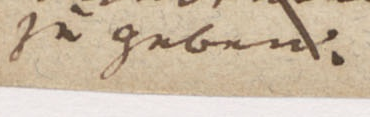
zu geben
